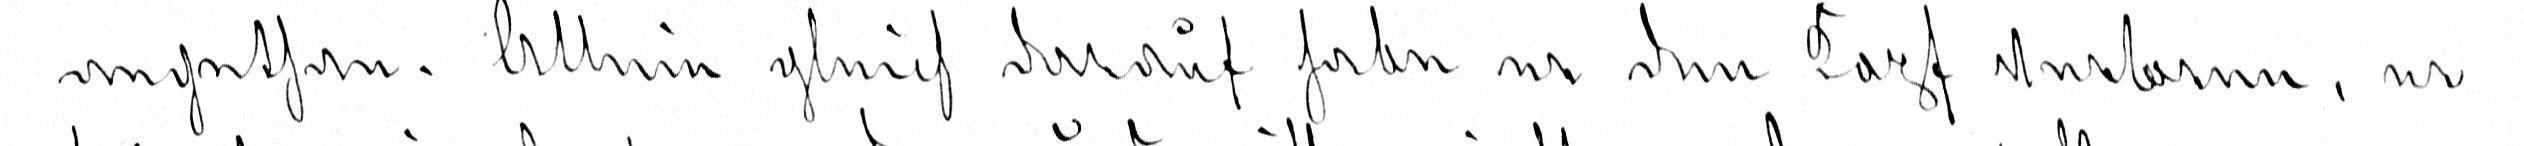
angethan. Allein gleich darauf habe er den Kopf verloren, er
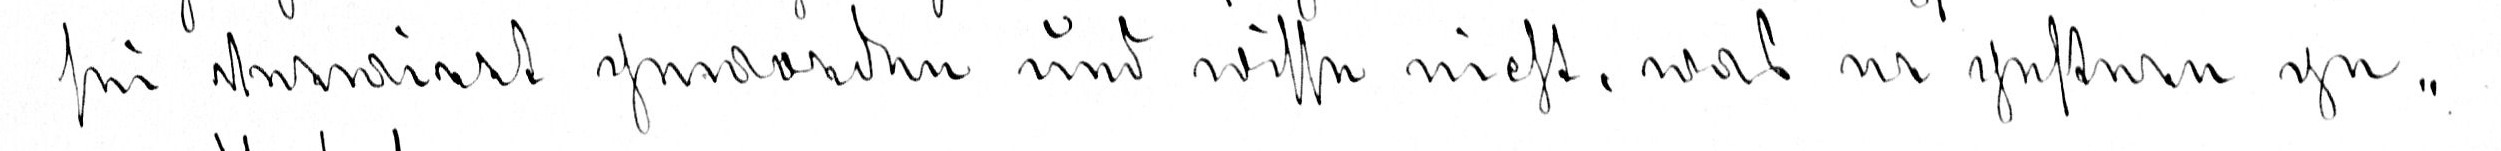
sei verwirrt geworden und wisse nicht, was er gestern ge¬
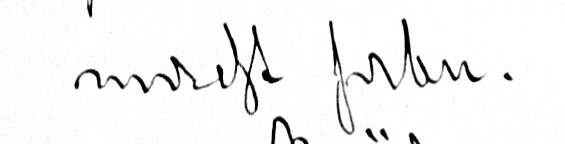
macht habe.
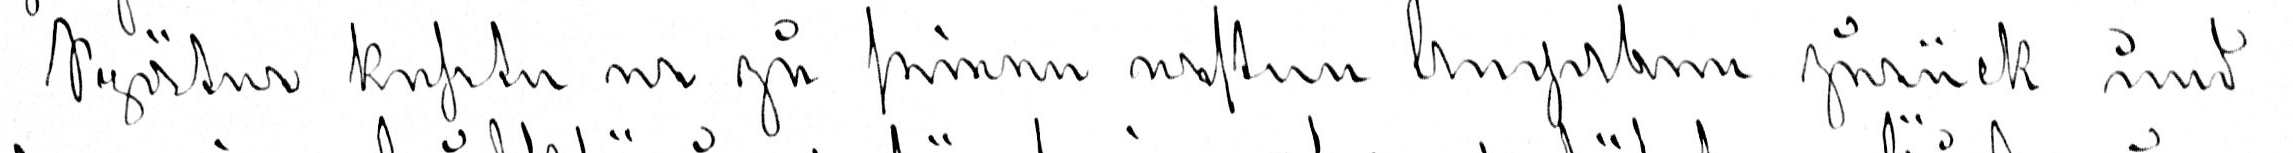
Später kehrte er zu seinen ersten Angaben zurück und
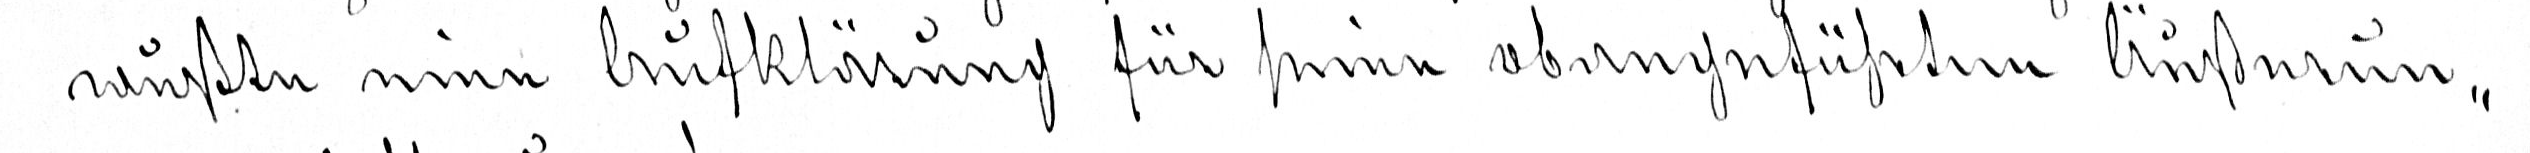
wußte eine Aufklärung für seine obangeführten Äußerun¬
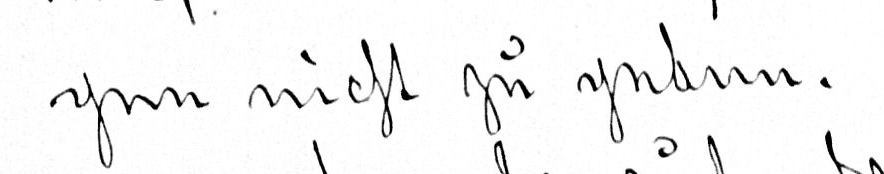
gen nicht zu geben.
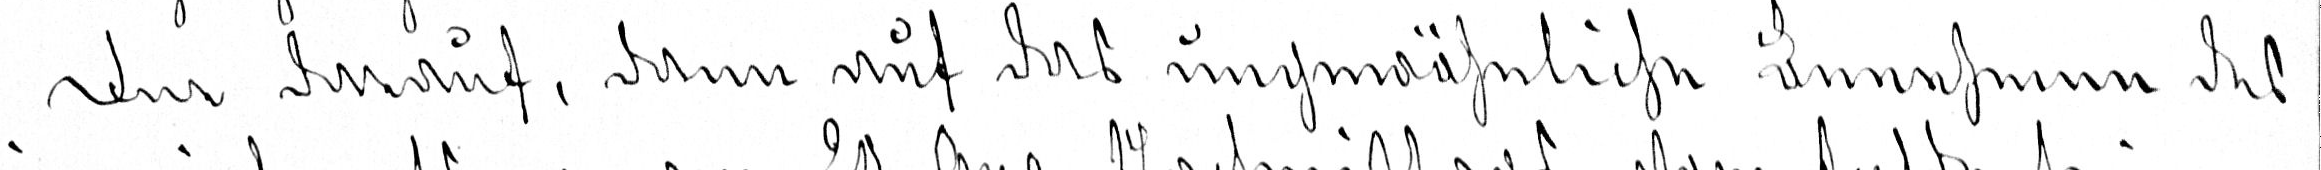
Der darauf, dann auf das ungewöhnliche Benehmen des
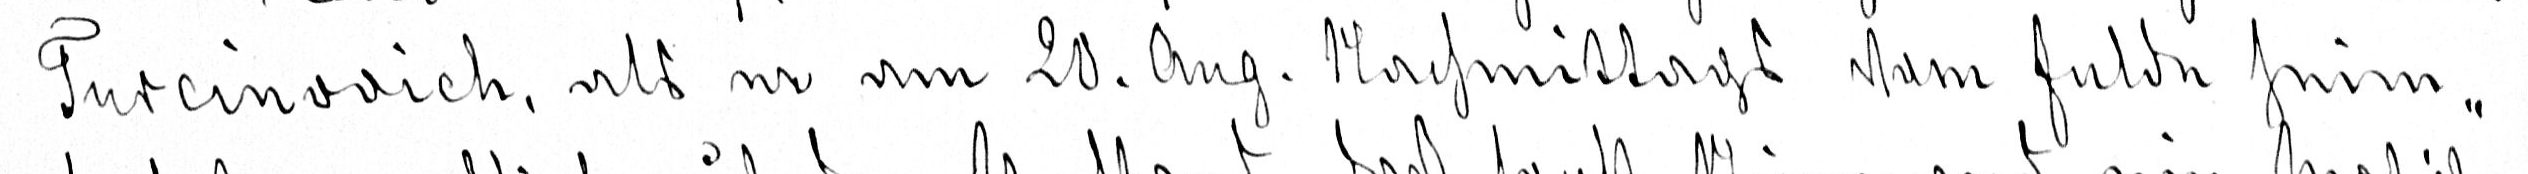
Turcinovich, als er am 20. Aug. Nachmittags vom Felde heim¬
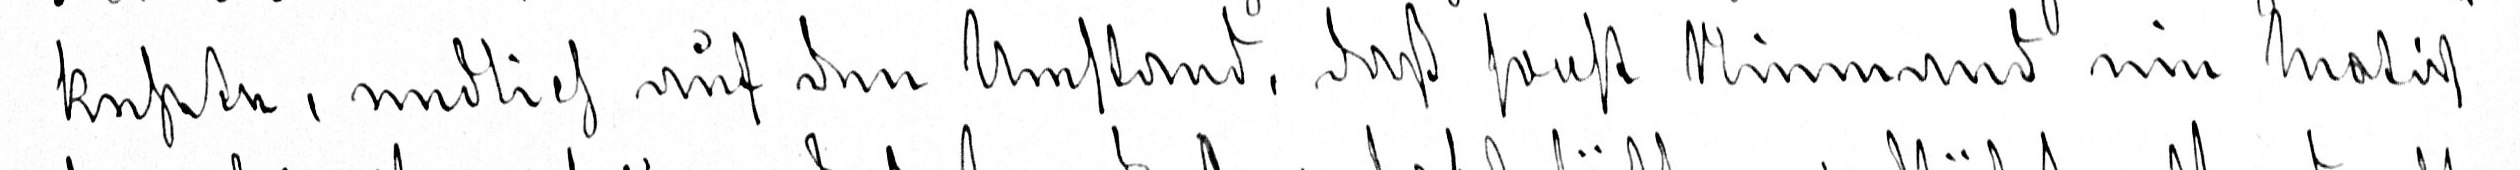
kehrte, endlich auf den Umstand, daß sonst Niemand ein Motiv
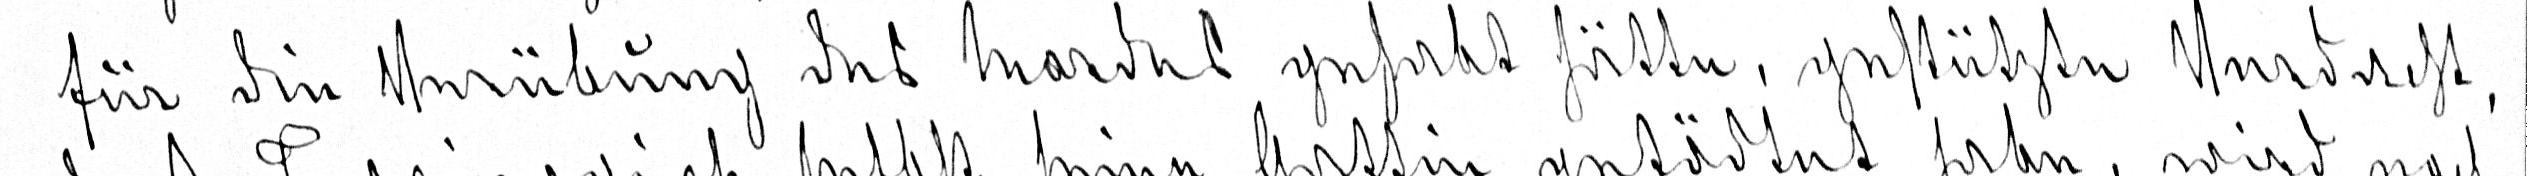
für die Verübung des Mordes gehabt hätte, gestützte Verdacht,
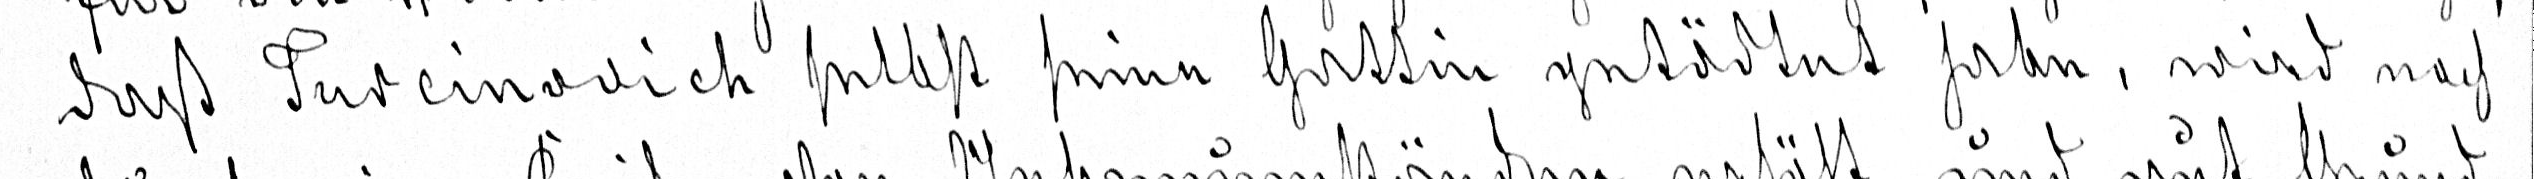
daß Turcinovich selbst seine Gattin getödtet habe, wird noch
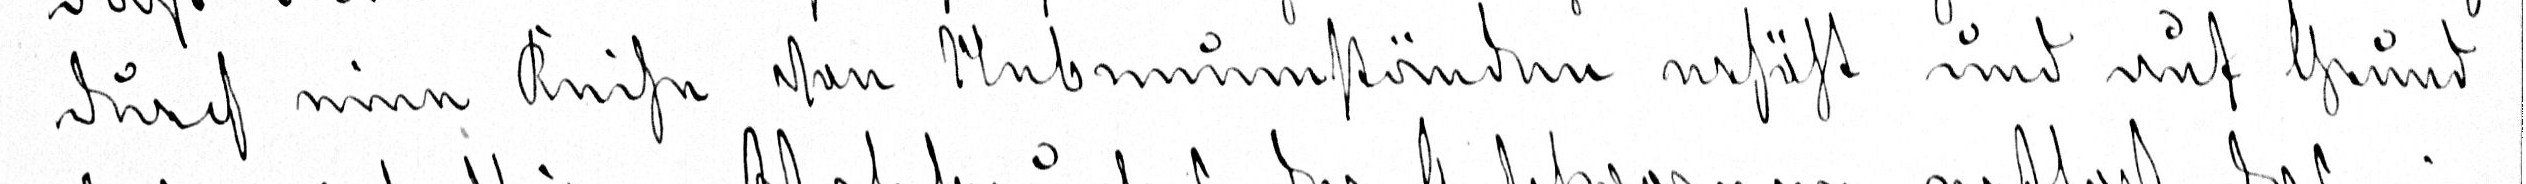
durch eine Reihe von Nebenumständen erhöht und auf Grund
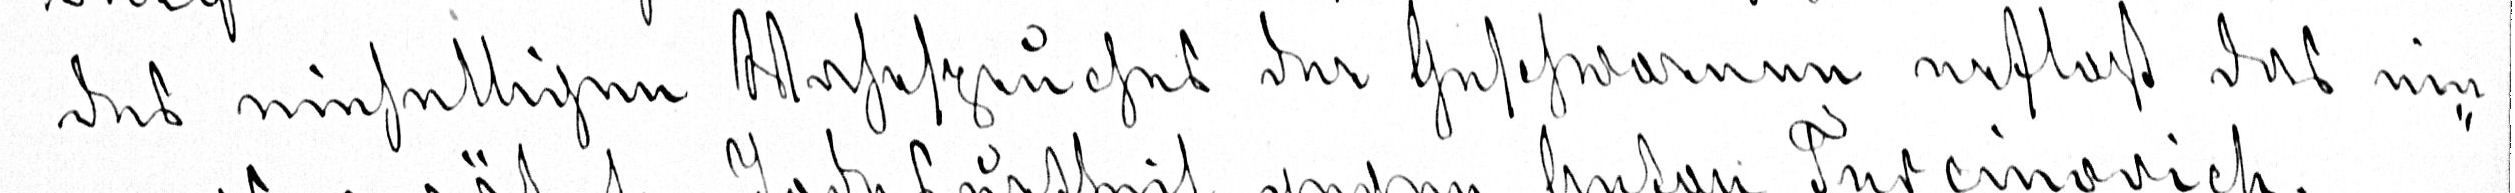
des einhelligen Wahrspruches der Geschwornen erfloß das ein¬
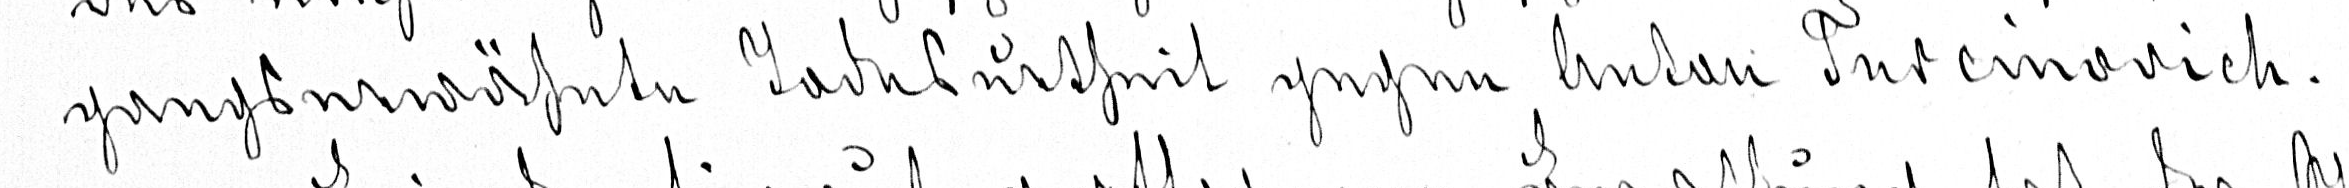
gangserwähnte Todesurtheil gegen Anton Turcinovich.
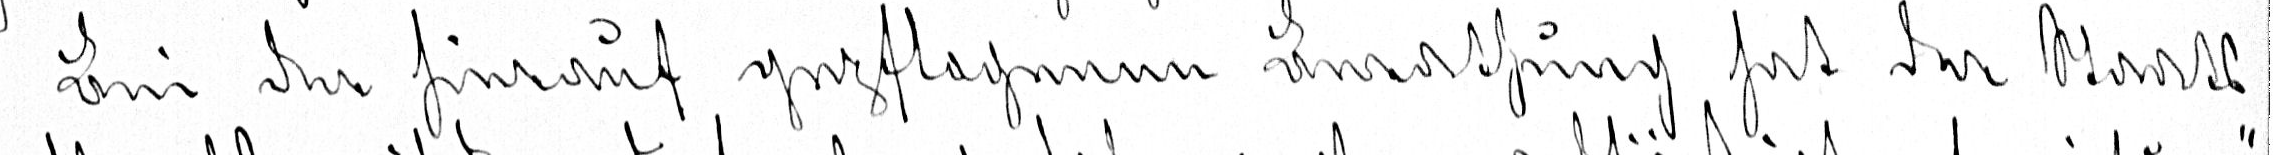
Bei der hierauf gepflogenen Berathung hat der Staat¬
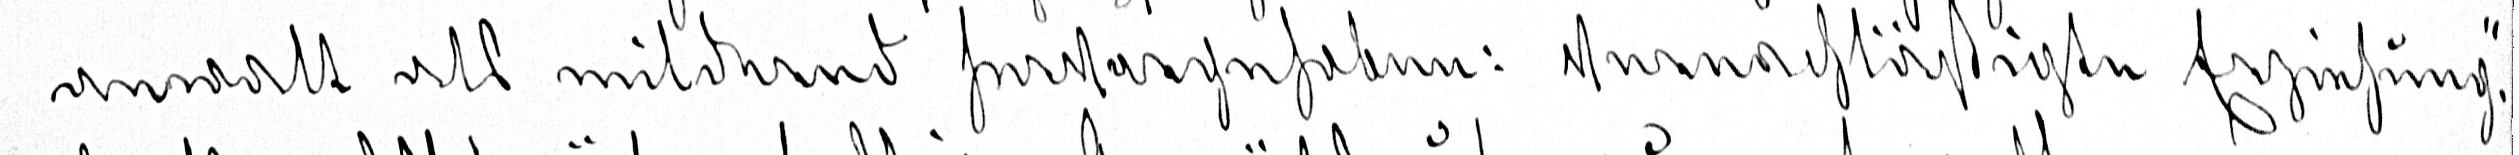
sanwalt als mildernd hervorgehoben: Vernachläßigte Erziehung.
